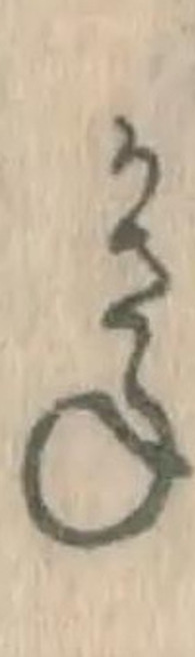かさね
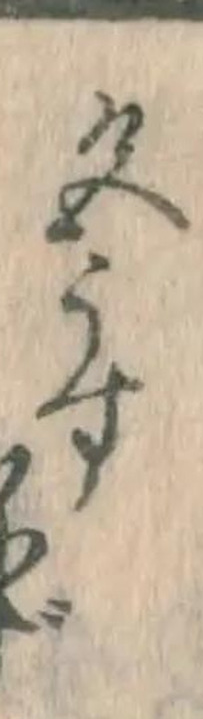色うす
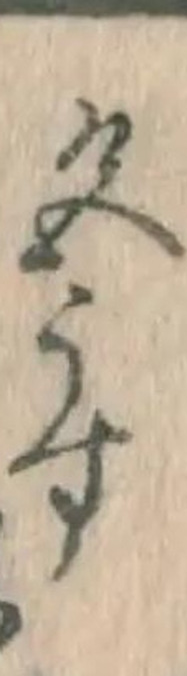色うす
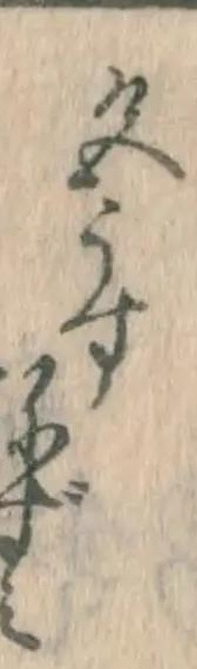色うす
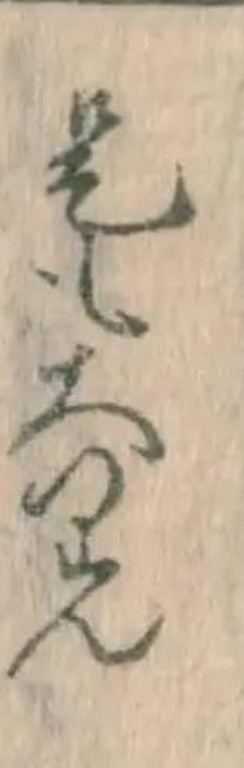是も大りん
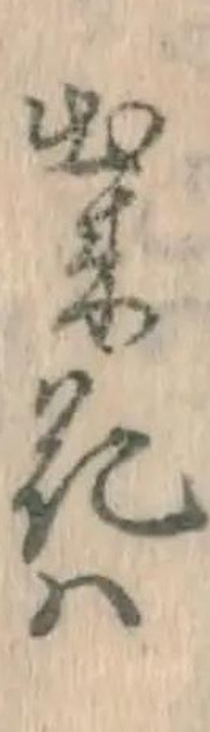出来花は
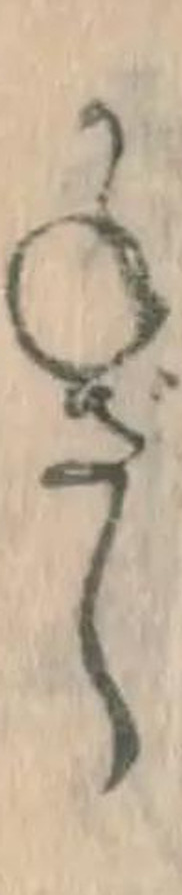かねざし
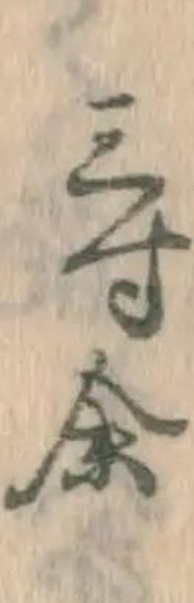三寸余
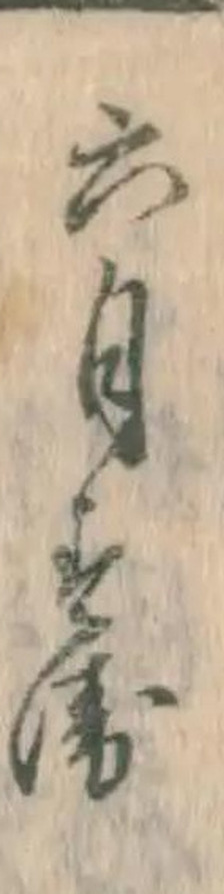六月すえ
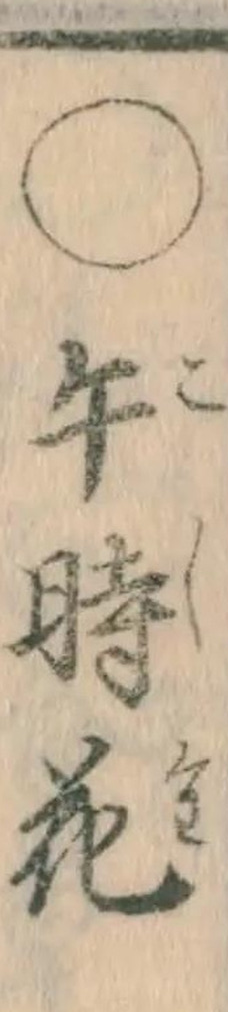〇午時花
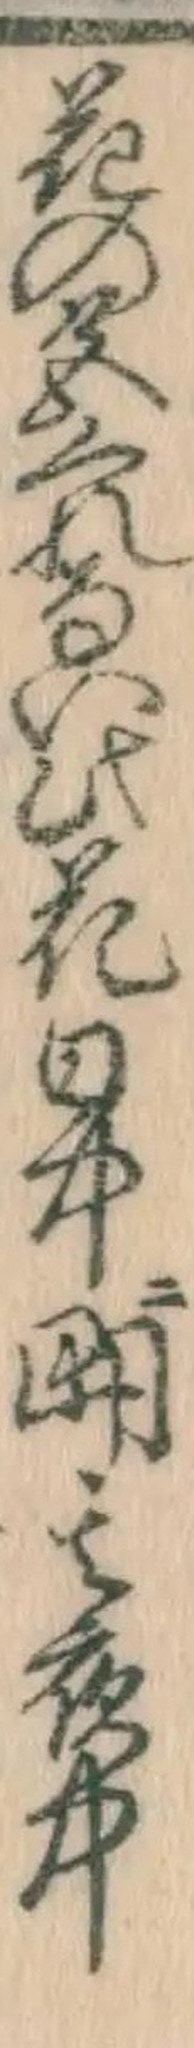花の色くれない此花日中に開其夜中
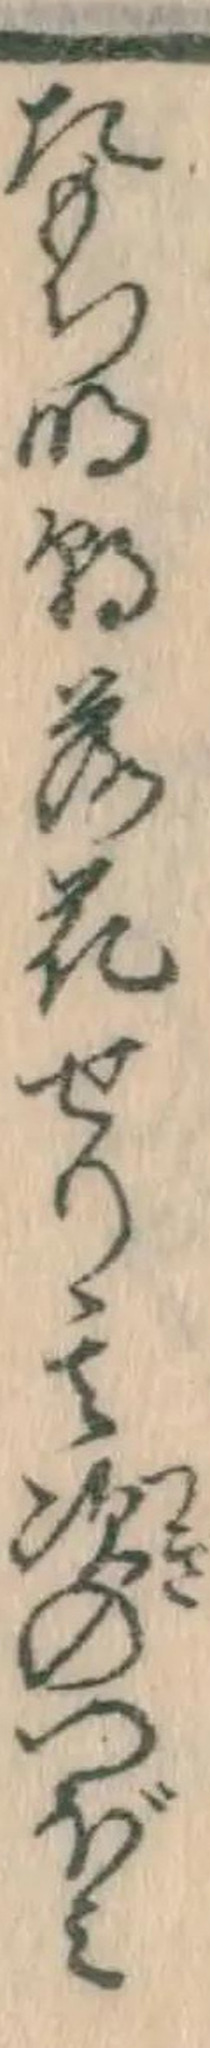たもち明朝落花せり其次のつぼみ
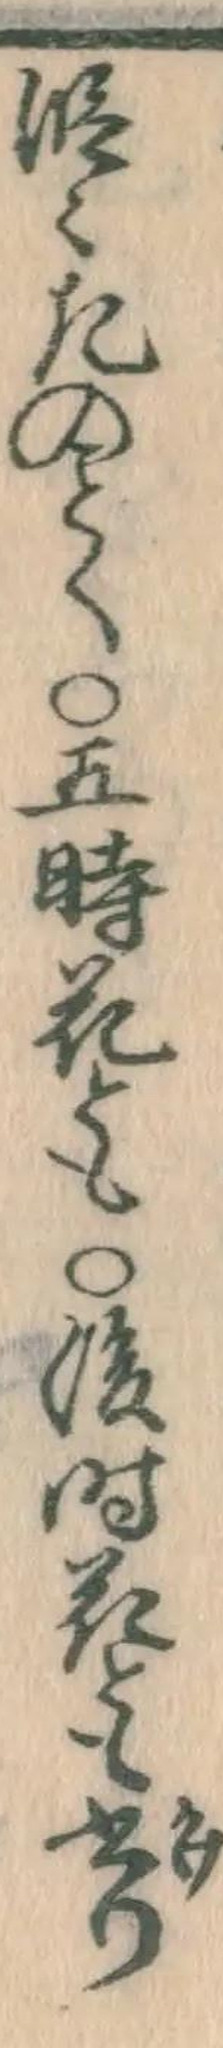段々左のことく〇五時花とも〇後時花とも書り
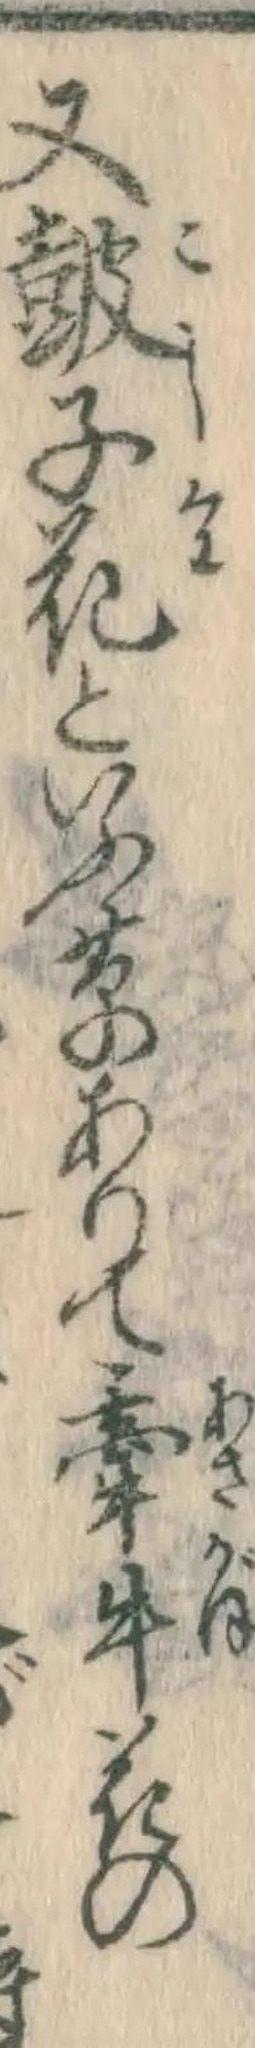又鼓子花といふ草ありて牽牛花の
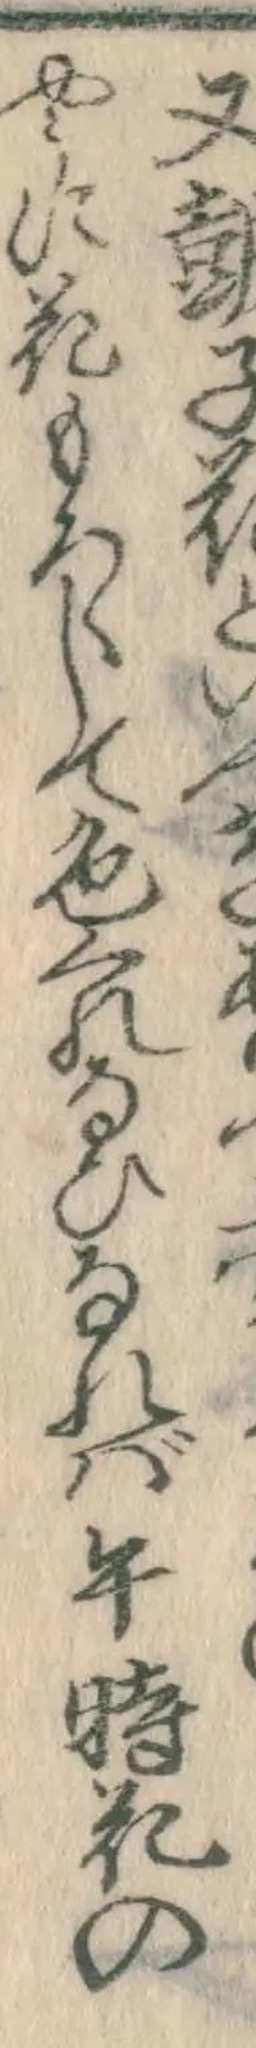やうに花もろくして色くれなひなれば午時花の
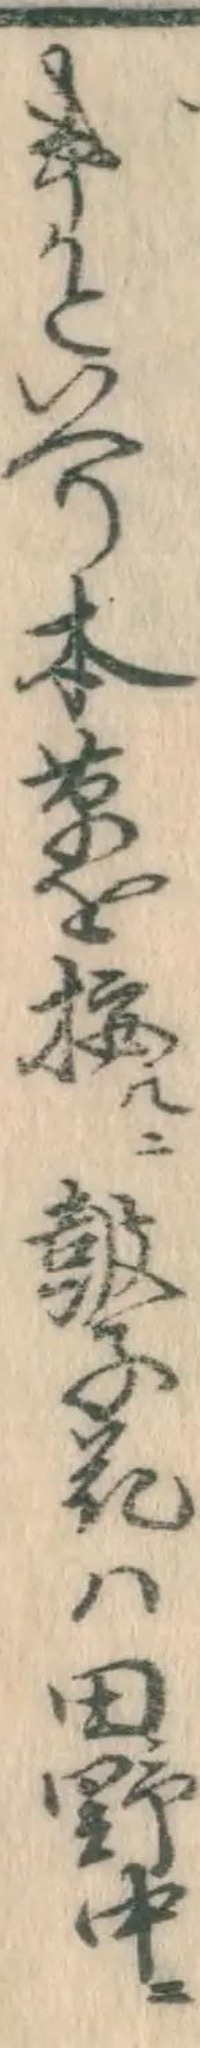事かといへり本草をるに鼓子花は田野中に
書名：艸花繪前集. [3]
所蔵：国立国会図書館 National Diet Library, JAPAN
